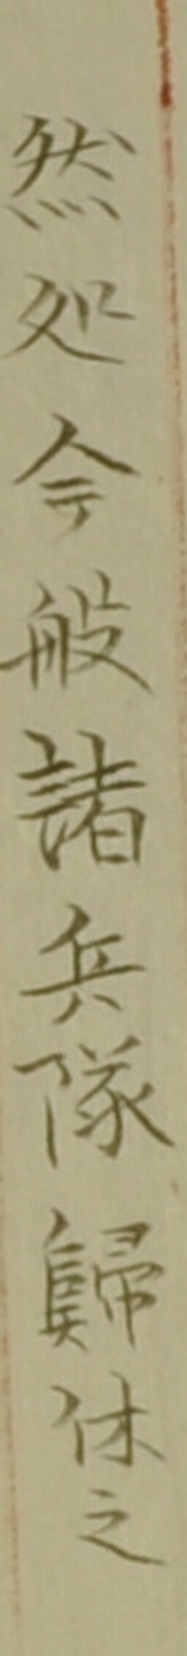然処今般諸兵隊帰休之
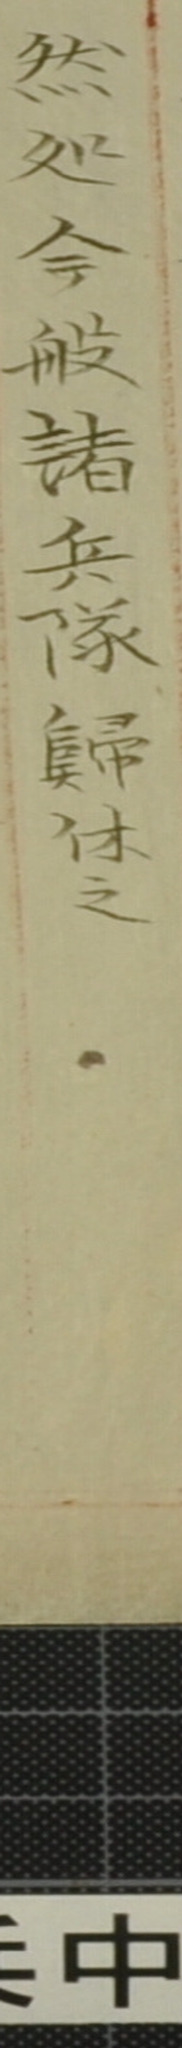然処今般諸兵隊帰休之
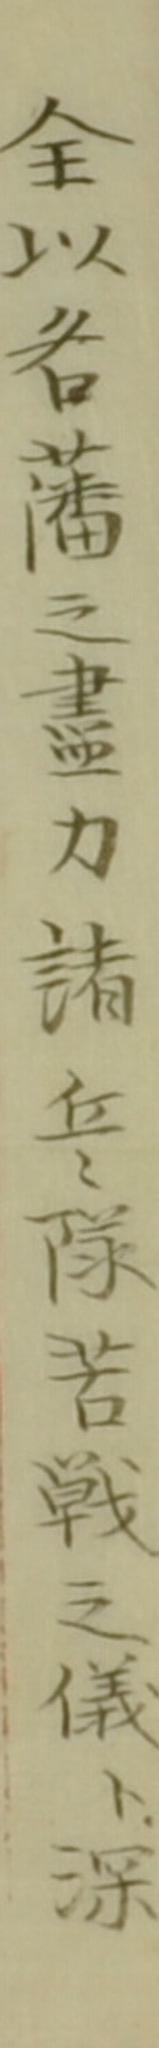全以各藩之尽力諸兵隊苦戦之儀ト深
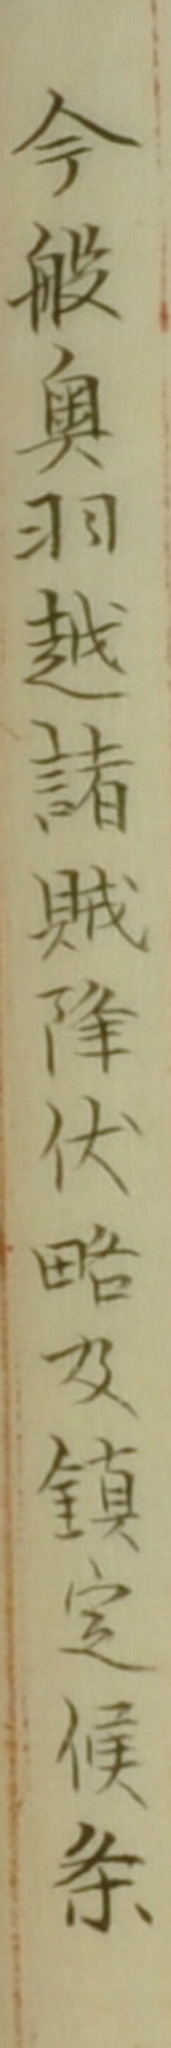今般奥羽越諸賊降伏略及鎮定候条
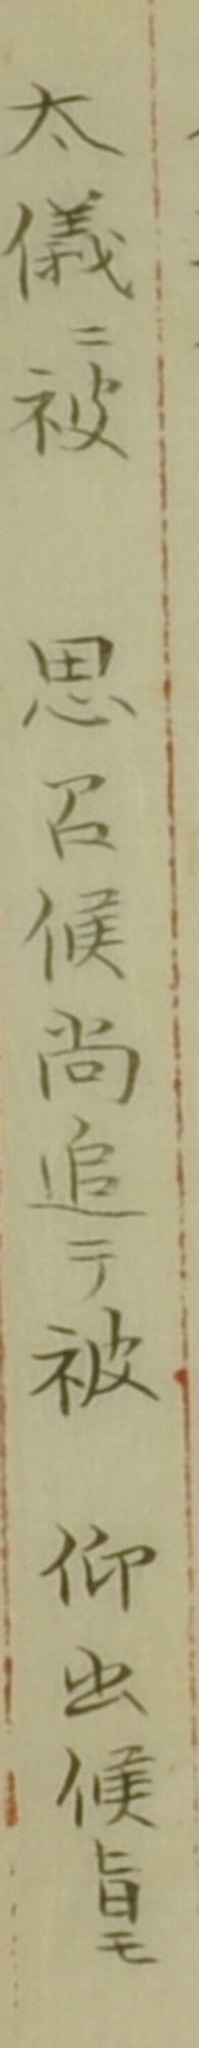太儀ニ被思召候尚追テ被仰出候旨モ
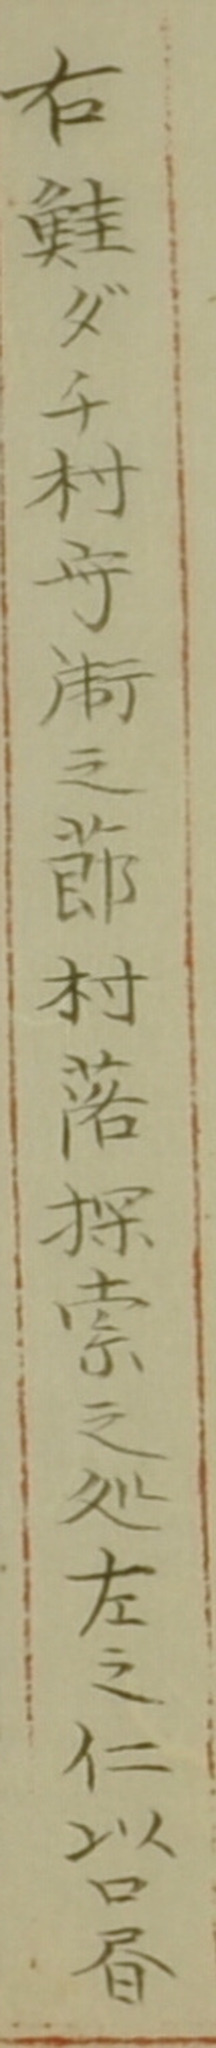右鮭ダチ村守衛之節村落探索之処左之仁以口書
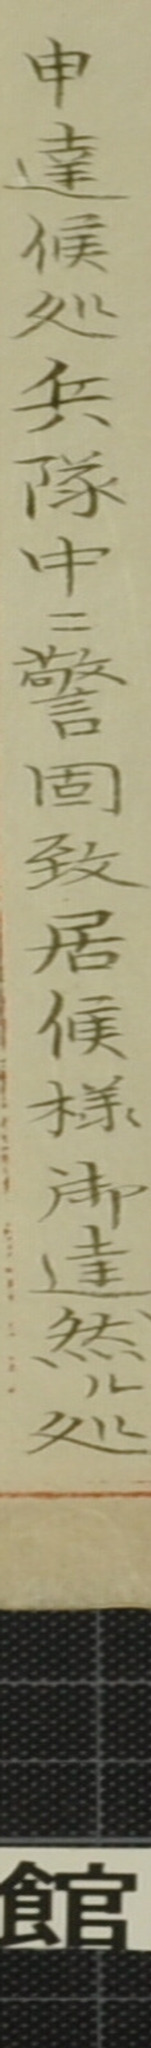申達候処兵隊中ニ警固致居候様御達然ル処
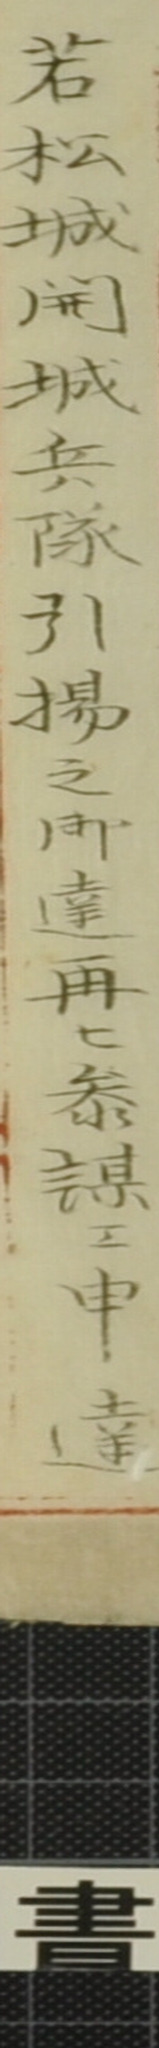若松城開城兵隊引揚之御達再ヒ参謀エ申達

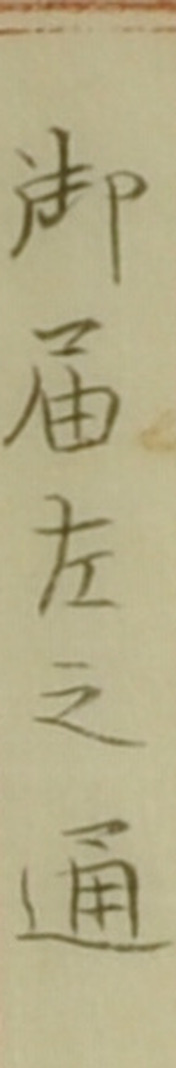御届左之通
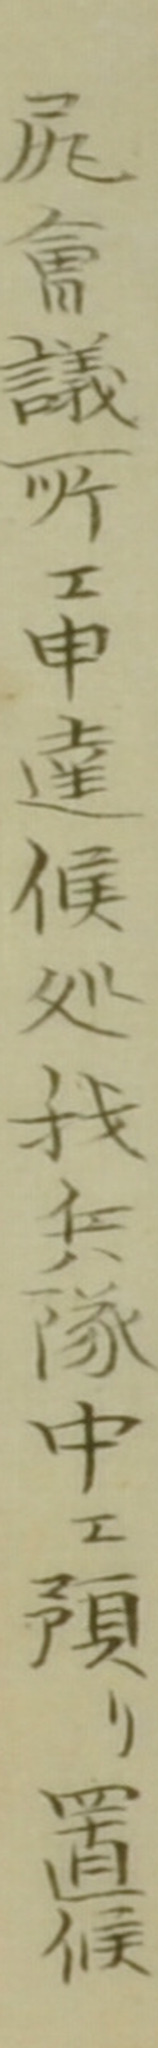尻会議所エ申達候処我兵隊中エ預リ置候
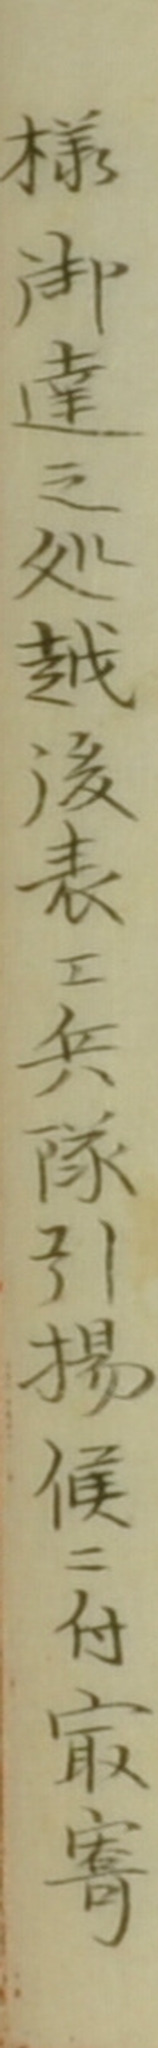様御達之処越後表エ兵隊引揚候ニ付最寄
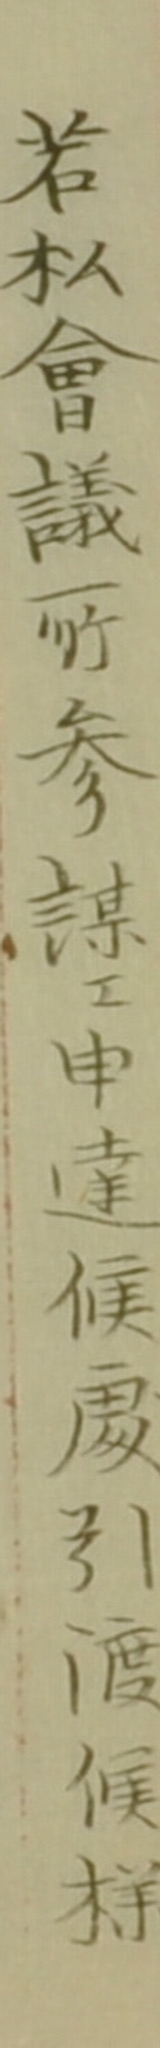若松会議所参謀エ申達候処引渡候様
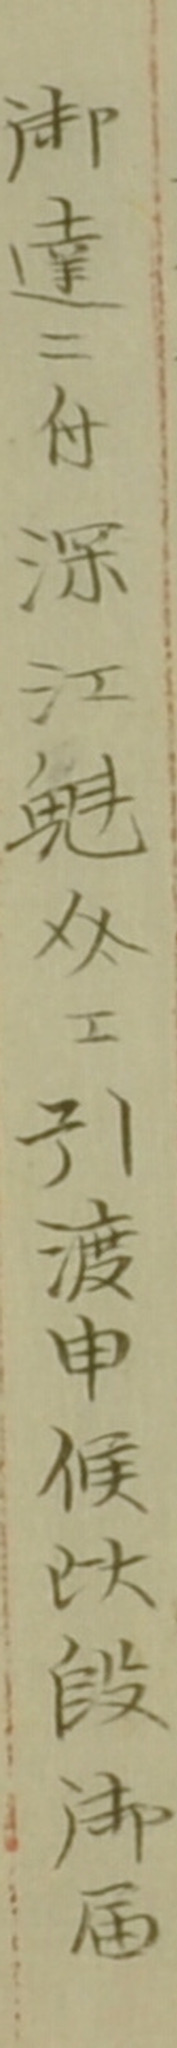御達ニ付深江魁介エ引渡申候此段御届
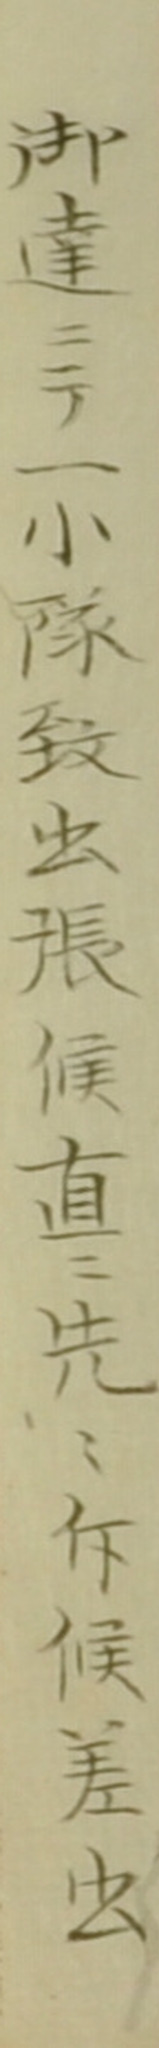御達ニテ一小隊致出張候直ニ先々斥候差出

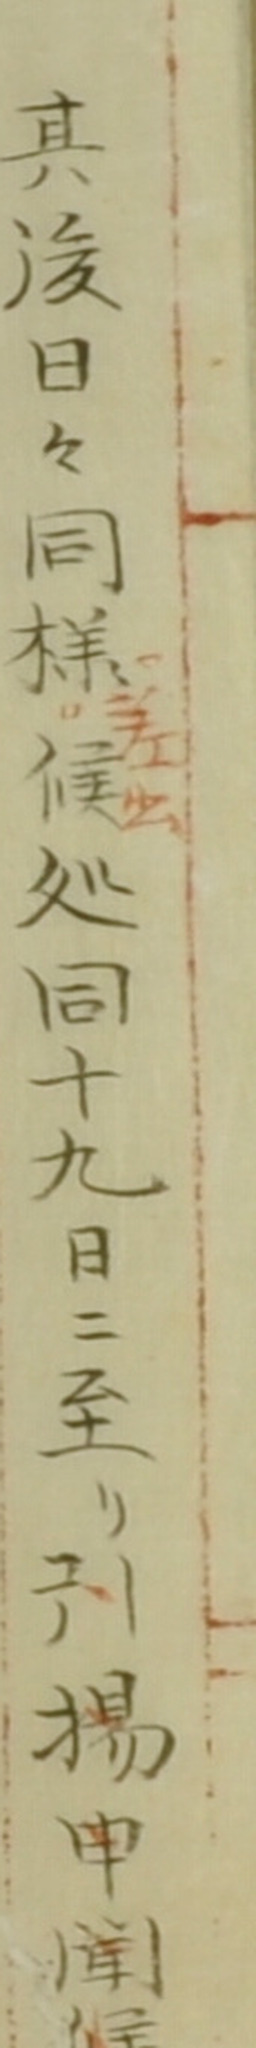其後日々同様差出候処同十九日ニ至リ引揚申聞候
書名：奥越出兵中戦争之事件概略抄録（控）
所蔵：伊那市立高遠町図書館・合同会社AMANE
